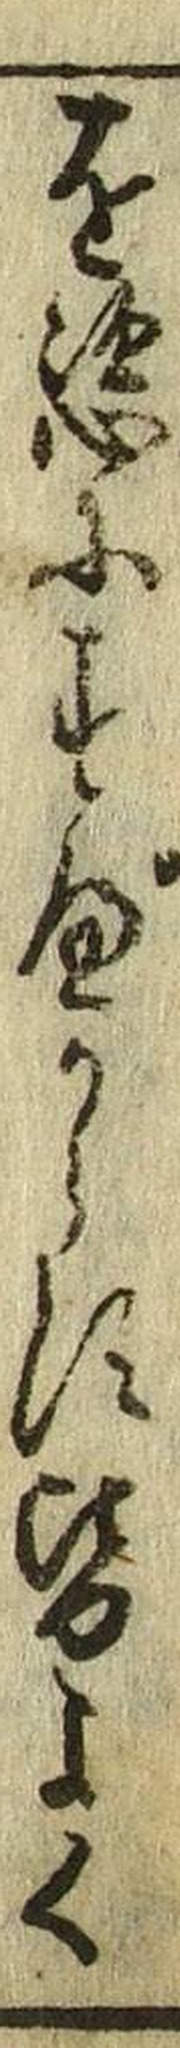を恣にすべからす皆よく
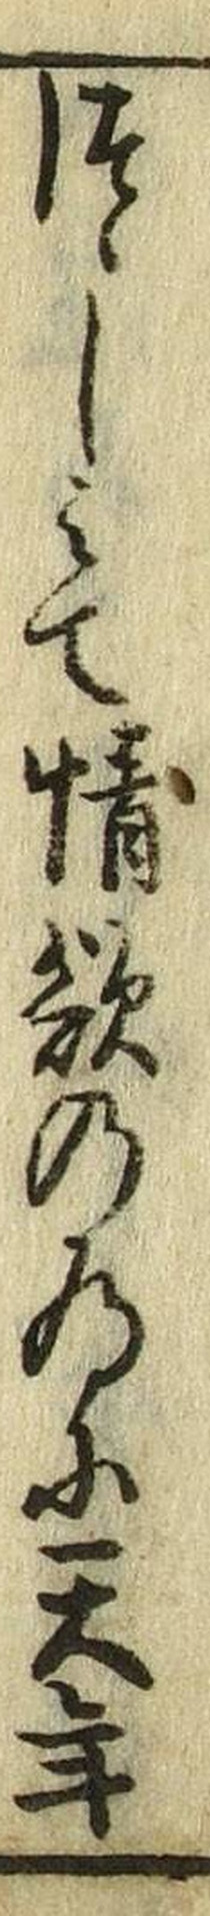つゝしみて情欲の為に天年
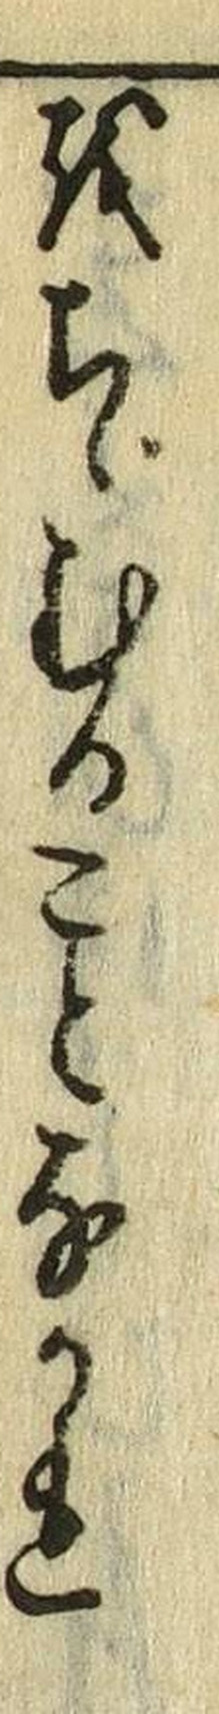をちゞむることなかれ
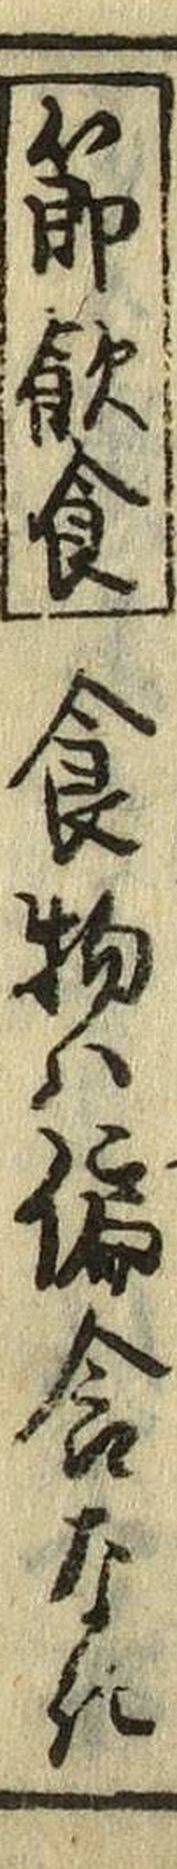節飲食食物は偏食なき
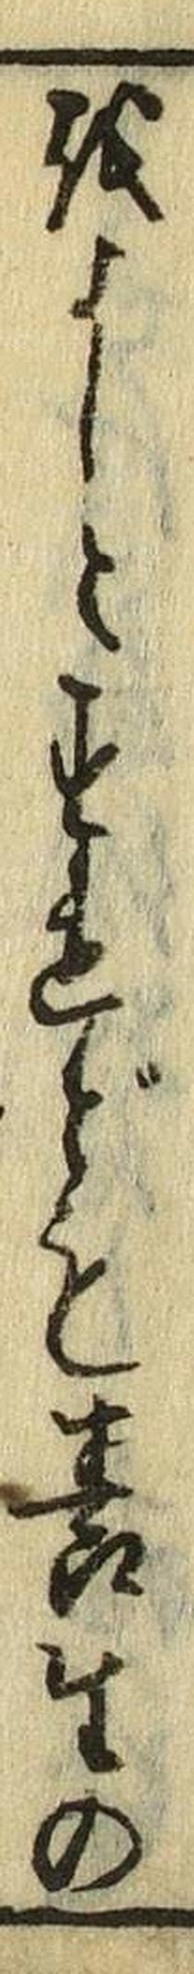をよしとすれども養生の
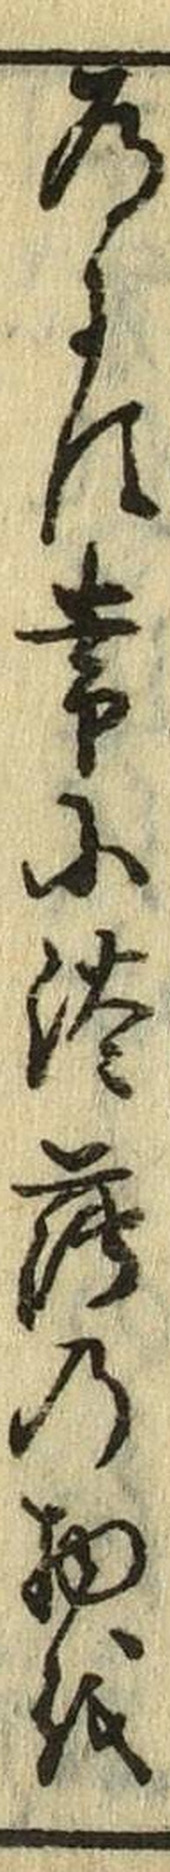為には常に淡薄の物を
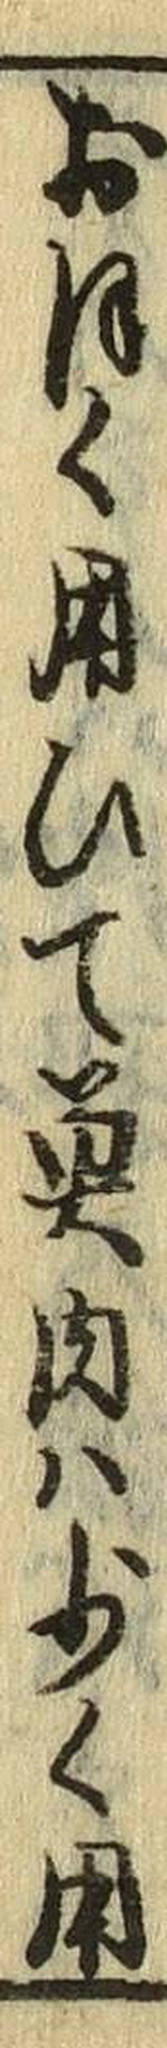おほく用ひて魚肉は少く用
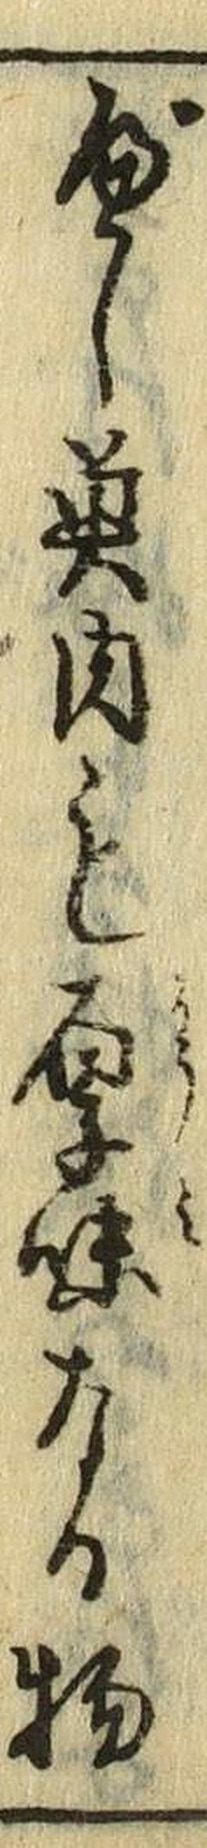べし魚肉も厚味なる物
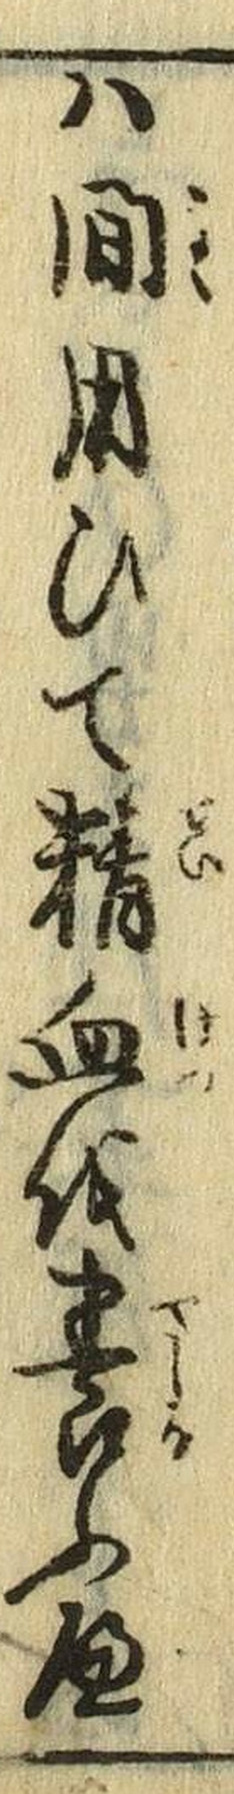は間用ひて精血を養ふへ
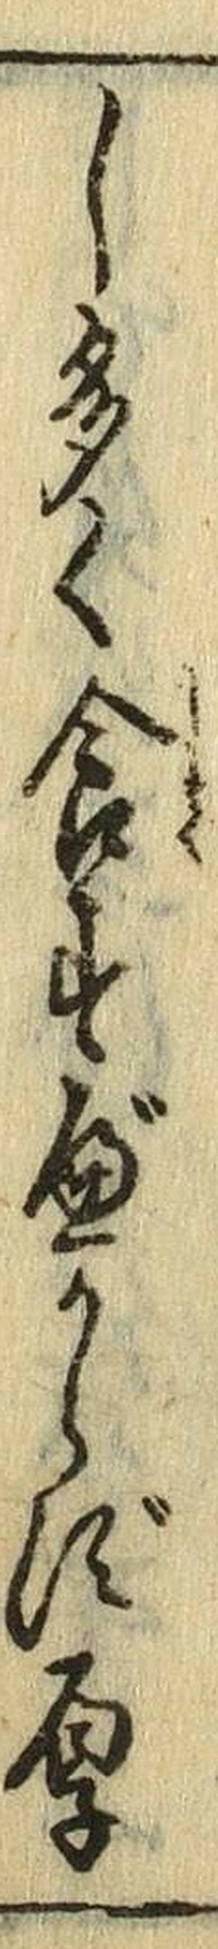し多く食すべからず厚
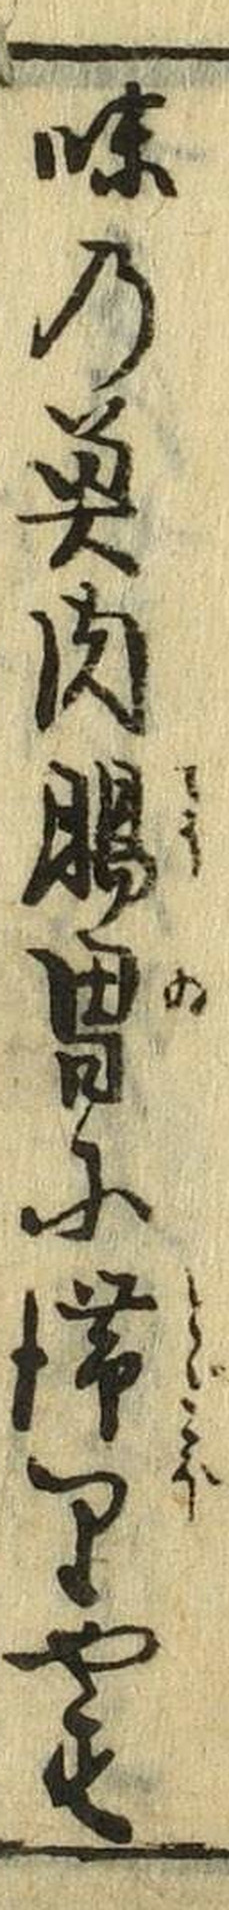味の魚肉腸胃に滞りやす
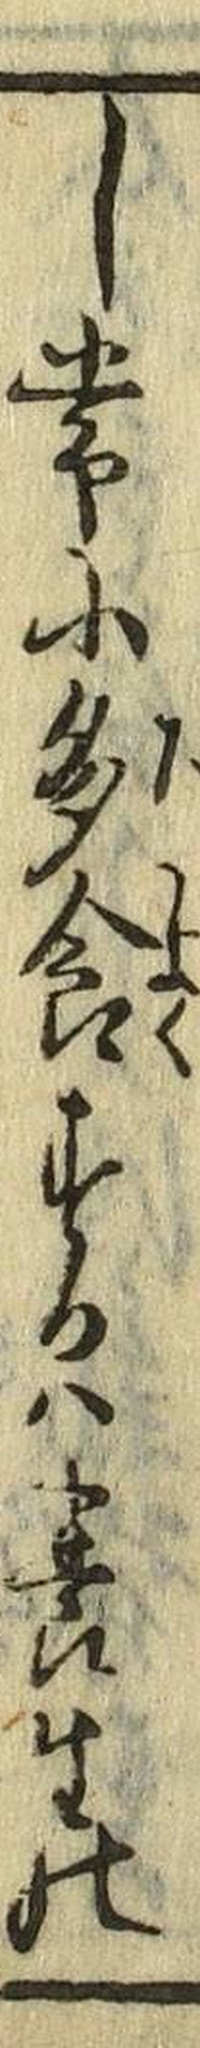し常に多食するは養生の
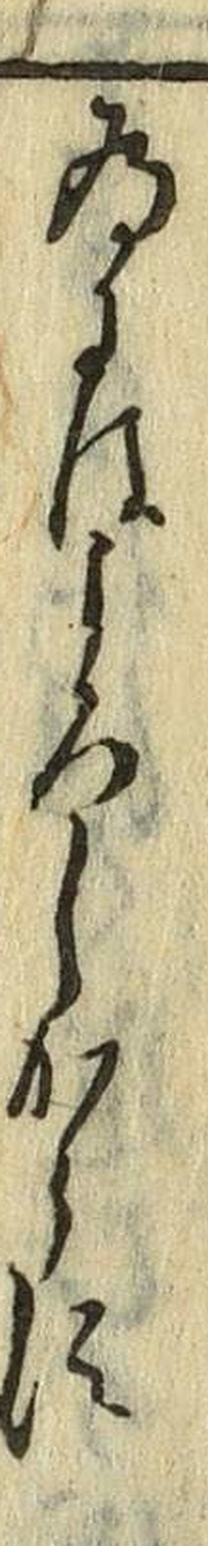為にはよろしからす
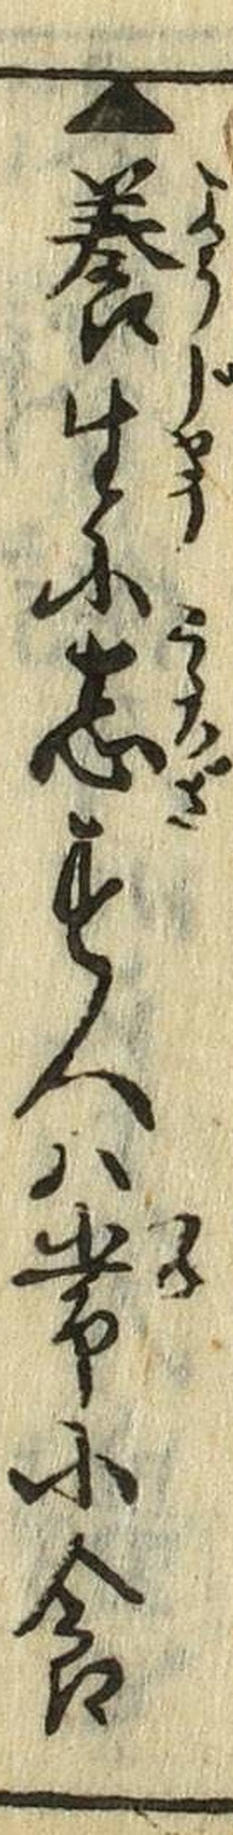▲養生に志す人は常に食
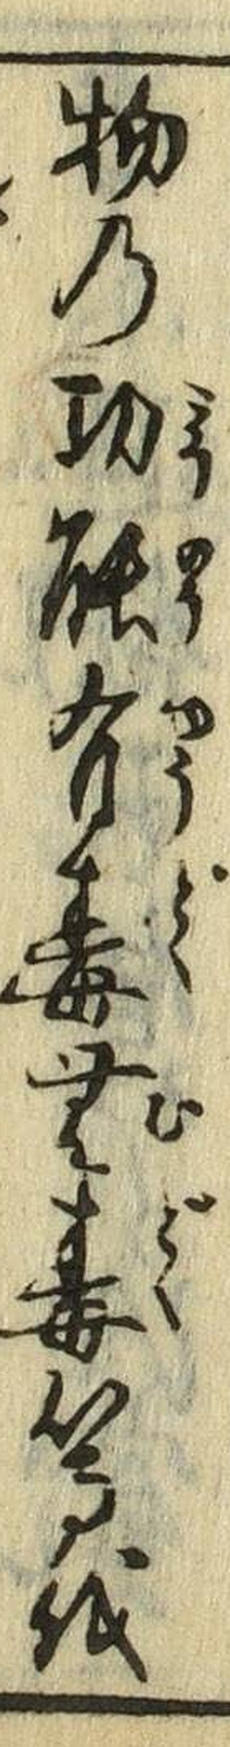物の功能有毒無毒等を
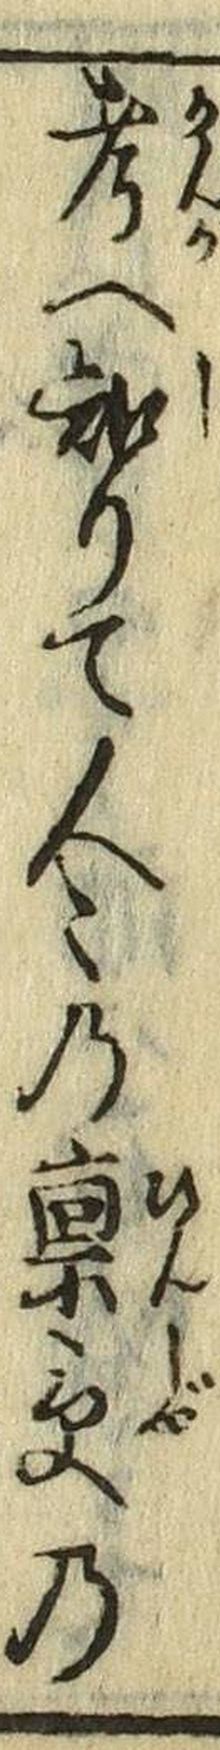考へ知りて人々の稟受の
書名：居家養生記
